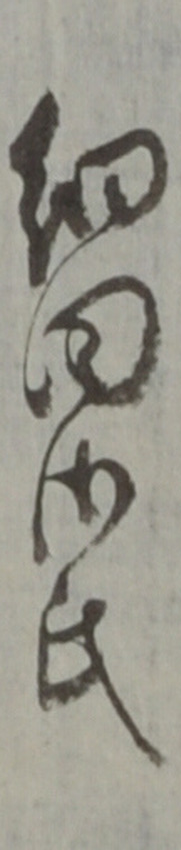細田御氏
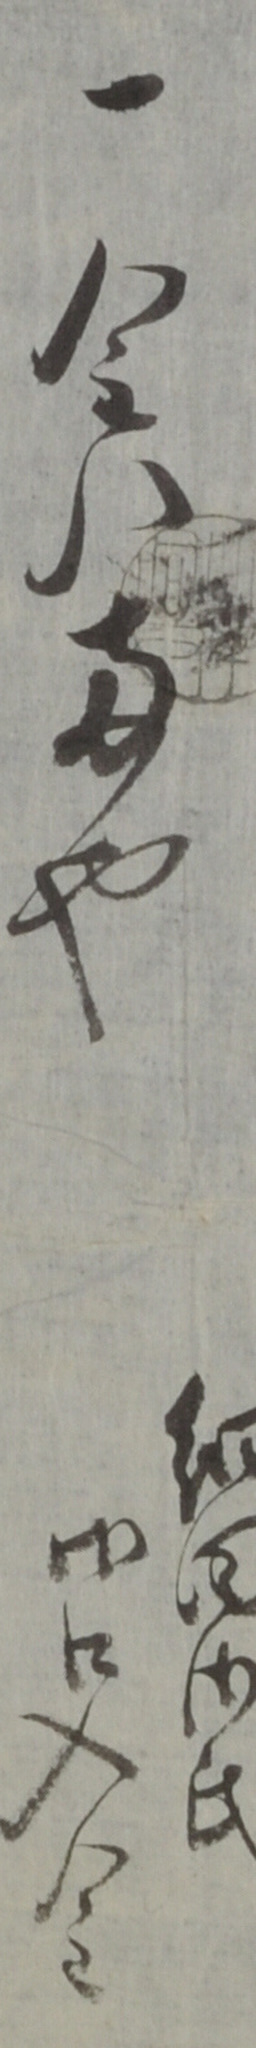一金八両也御口入金
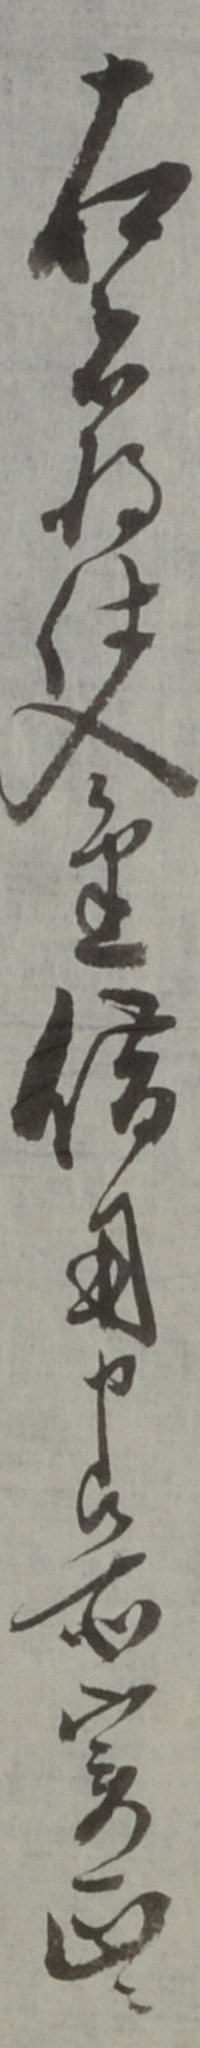右は為仕入金借用申候所実正ニ
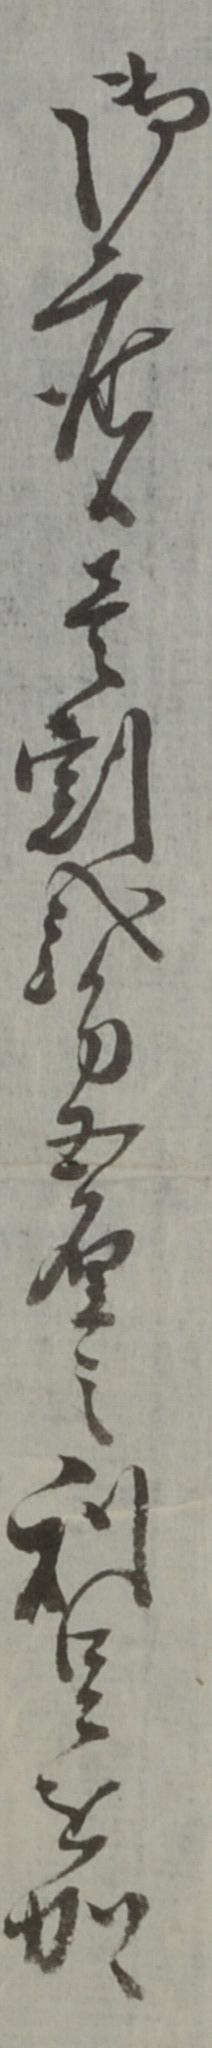御座候壱割弐分五厘之利足を加へ
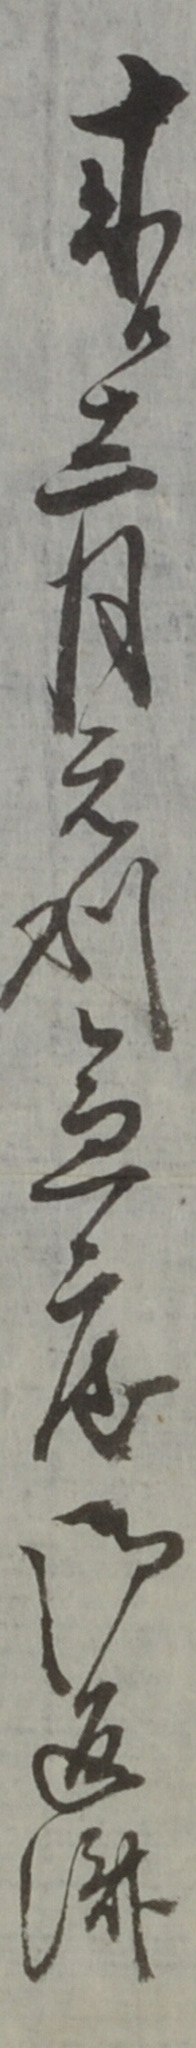来ル十二月元利急度御返済
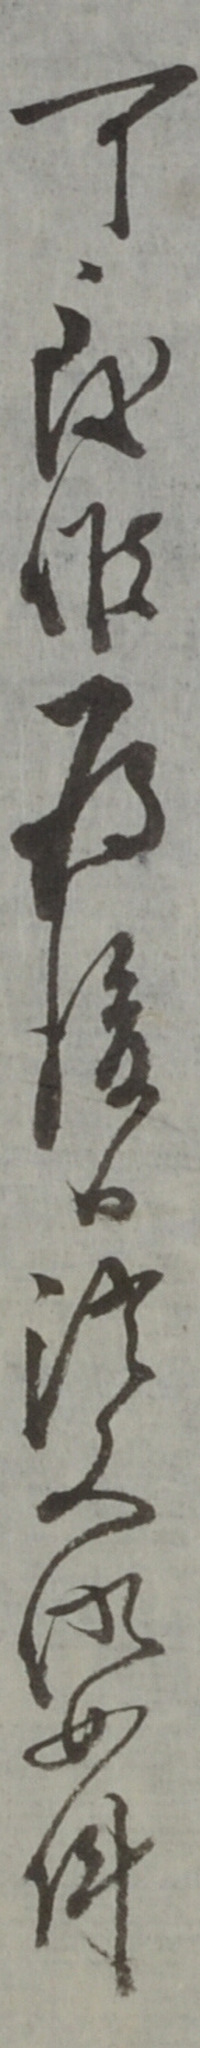可致候為後日証文仍如件
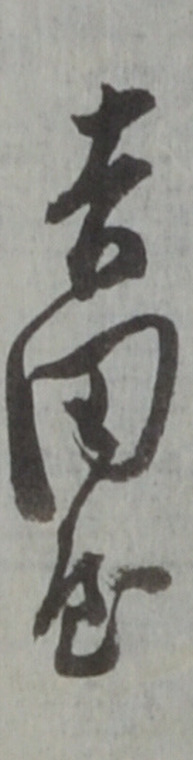吉田屋
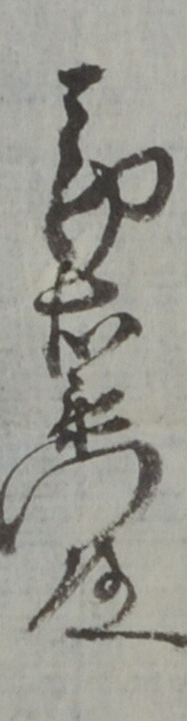勘右衛門殿
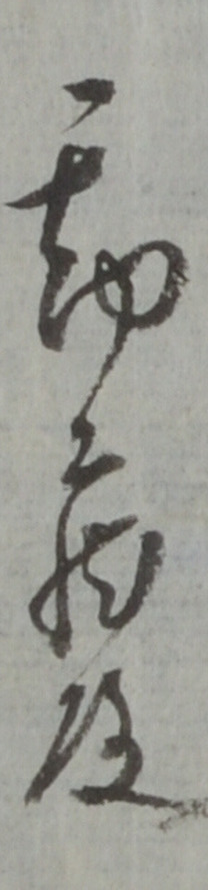勘蔵殿

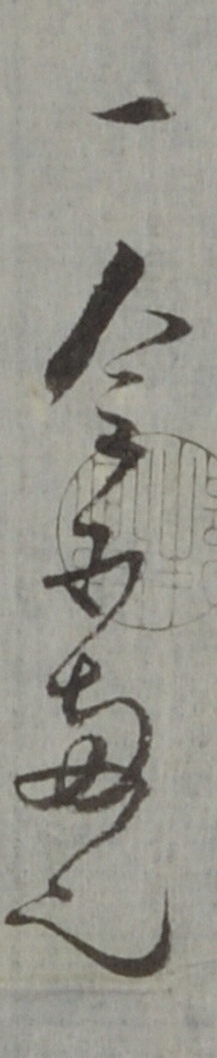一金五両也
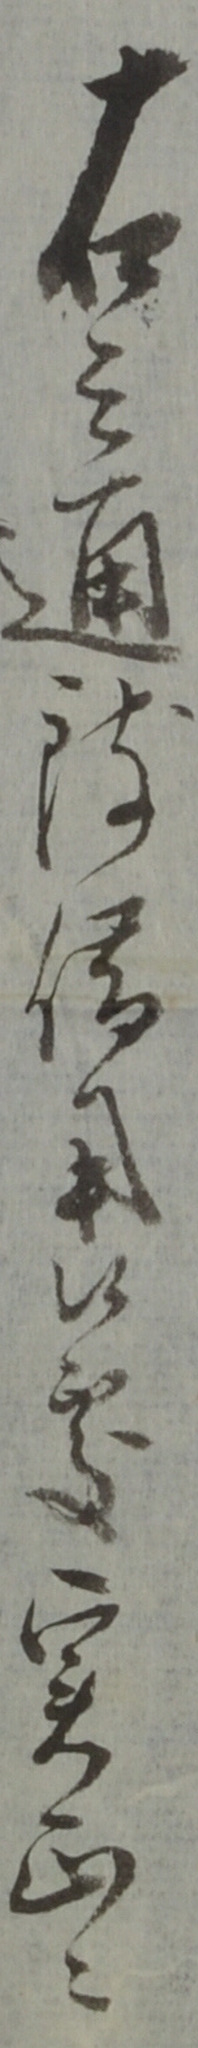右之通致借用候処実正ニ
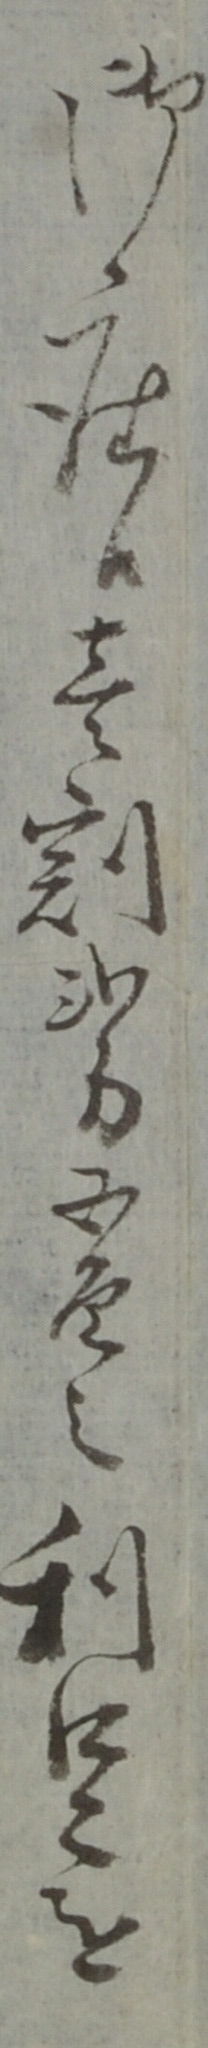御座候壱割弐分五厘之利足を
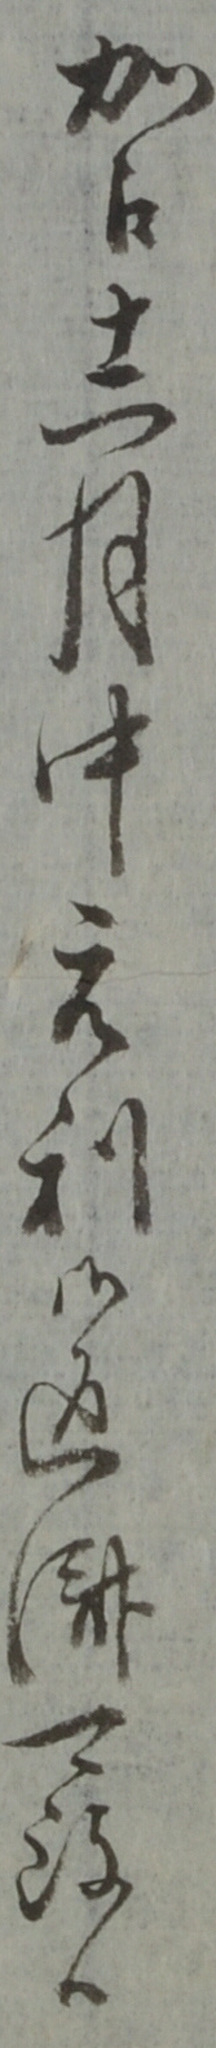加江十二月中元利御返済可致候
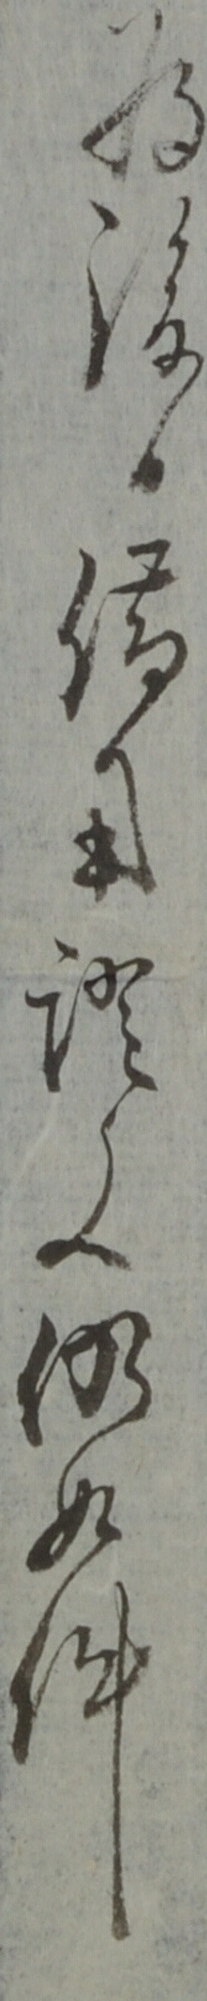為後日借用証文仍如件
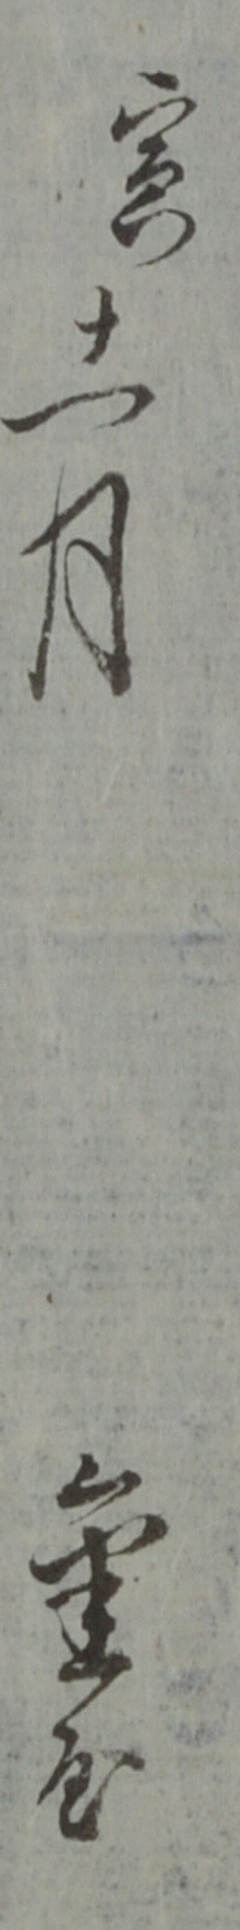十一月金屋
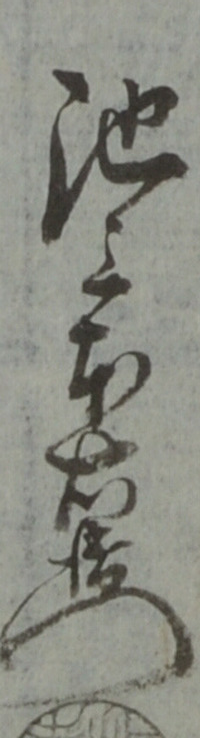池上本右衛門㊞
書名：拝借證文之事
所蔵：伊那市立高遠町図書館・合同会社AMANE
